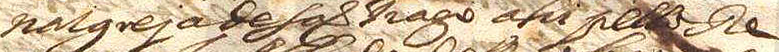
na igreja de saõ Tiago ahi pello Re
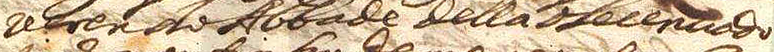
verendo Abbade della o Lecenciado
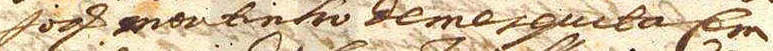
Joaõ moutinho de mesquita Com
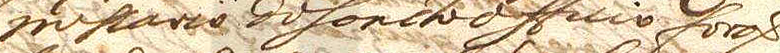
missario do sancto officio foraõ
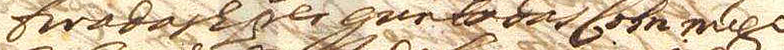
tiradas E perguntadas Commigo
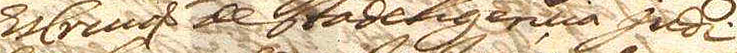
EsCreuaõ desta deligençia judi
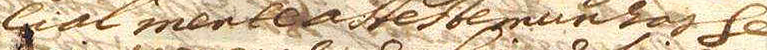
Cialmente as testemunhas se
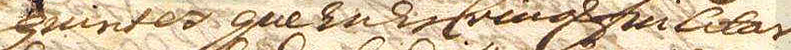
guintes que Eu EsCriuaõ fui citar
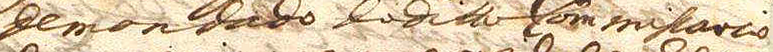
de mandado do ditto Commissario
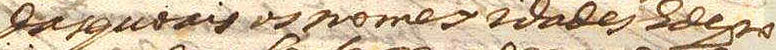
das quoais os nomes idades E depo
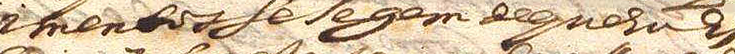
imentos se segem de que Eu Es
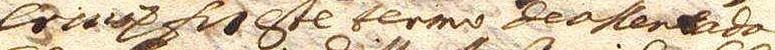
criuaõ fis este termo de assentada
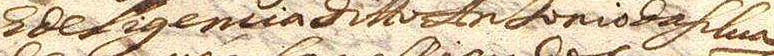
E deligençia ditto Antonio da silua
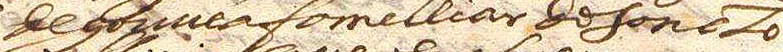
de gouuea fomelliar do sancto
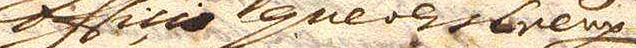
offiçio que o EsCreuy
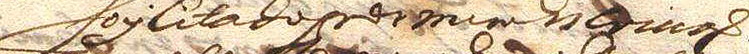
foy Citado por mim Escriuaõ
